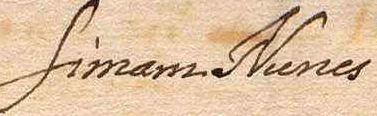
Simam Nunes
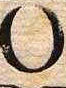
O
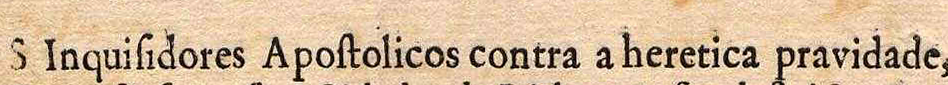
S Inquisidores Apostolicos contra a heretica pravidade,
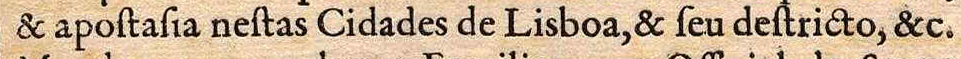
& apostasia nestas Cidades de Lisboa, & seu destricto, &c.
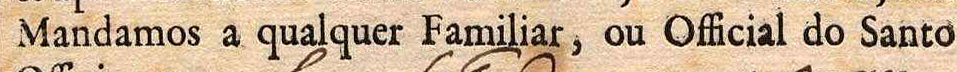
Mandamos a qualquer Familiar, ou Official do Santo
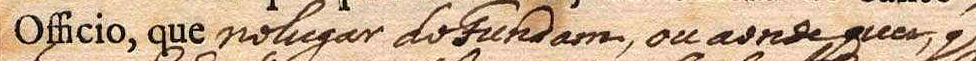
Officio, que no lugar do Fundam, ou aonde quer q̄
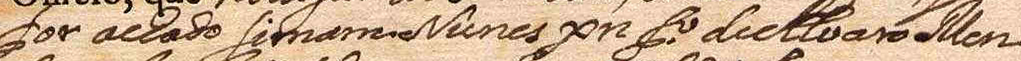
for achado simam Nunes xn f.o de Alvaro Men
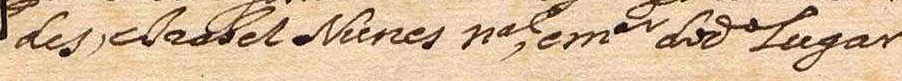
des, e Izabel Nunes nal, e mor do do Lugar
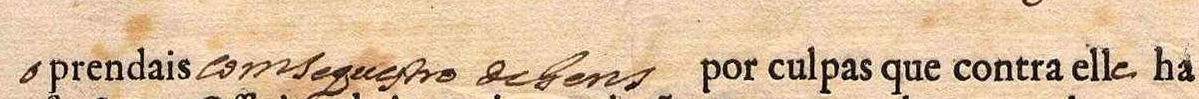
o prendais com sequestro de bens por culpas que contra elle ha
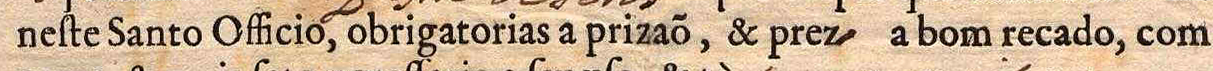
neste Santo Officio, obrigatorias a prizaõ, & prezo a bom recado, com
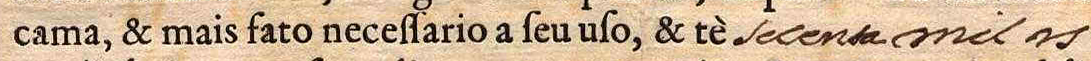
cama, & mais fato necessario a seu uso, & tè secenta mil rs
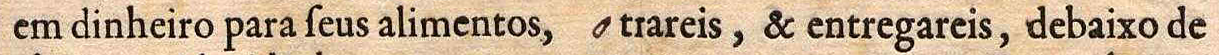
em dinheiro para seus alimentos, o trareis, & entregareis, debaixo de
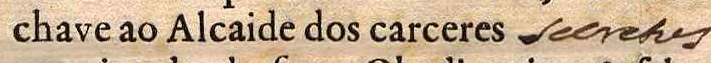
chave ao Alcaide dos carceres secretos
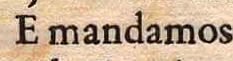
E mandamos
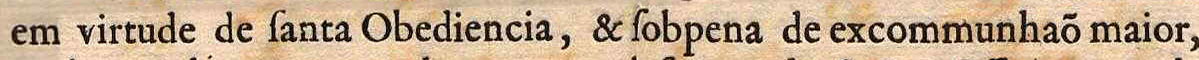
em virtude de santa Obediencia, & sob pena de excommunhaõ maior,
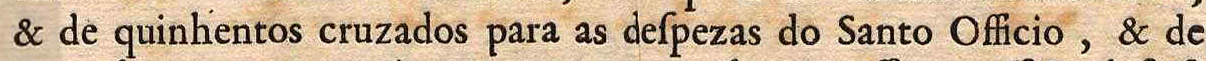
& de quinhentos cruzados para as despezas do Santo Officio, & de
